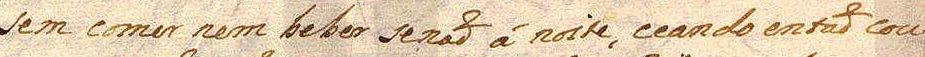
sem comer nem beber senaõ á noite, ceando entaõ cou
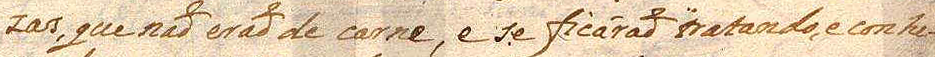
zas, que naõ eraõ de carne, e se ficáraõ tratando, e conhe
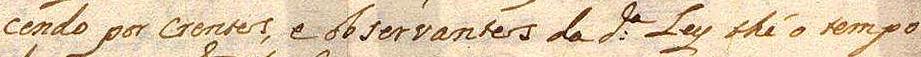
cendo por crentes, e observantes da d:a Ley thé o tempo
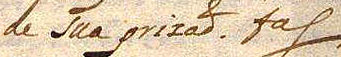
de sua prizaõ. ta
